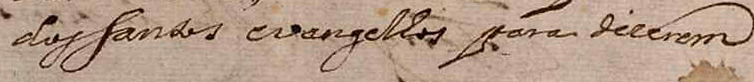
dos santos evangelhos para dizerem
